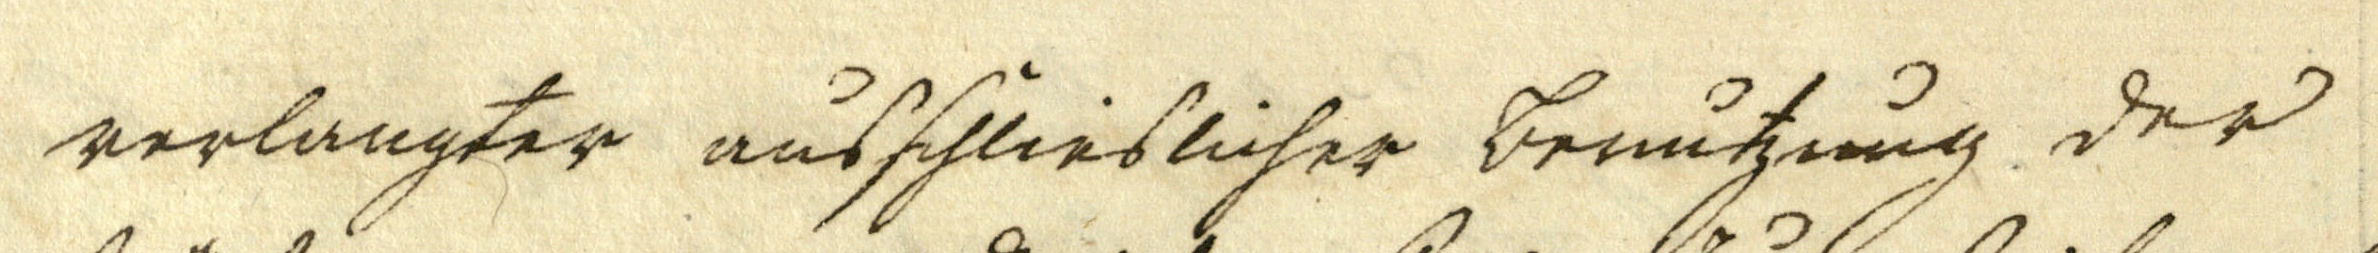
verlangter ausschlieslicher Benutzung der
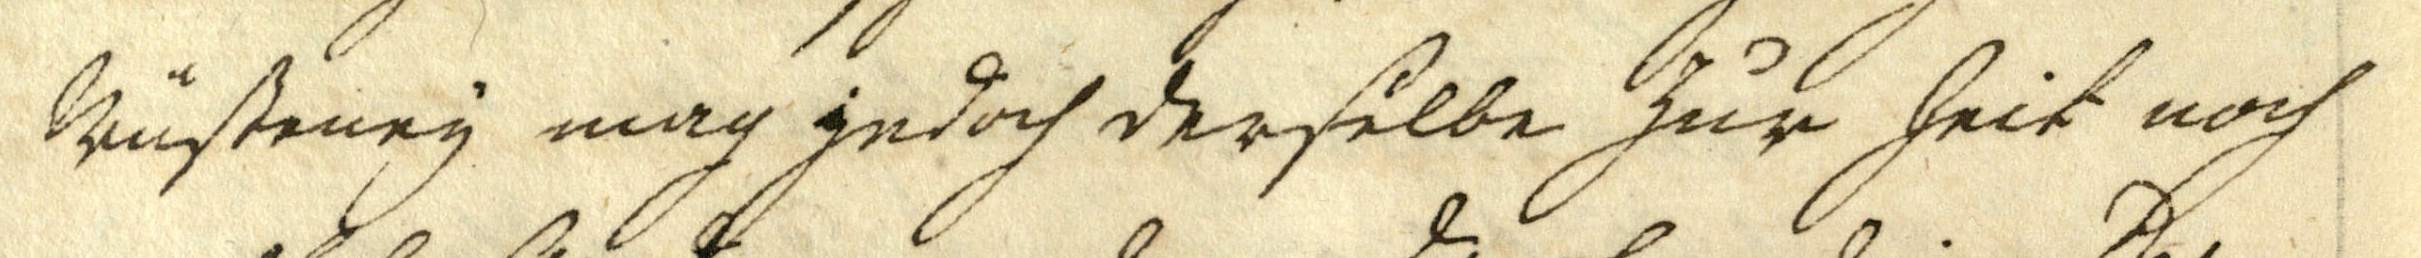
Wüsteneÿ man jedoch derselbe zur Zeit noch
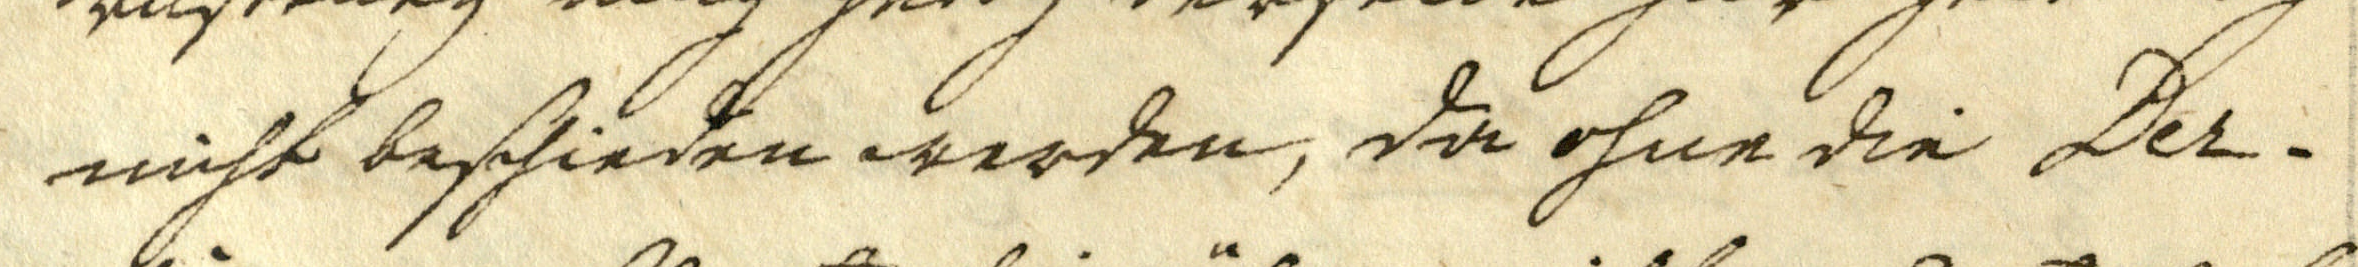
nicht beschieden werden, da ohne die Der¬
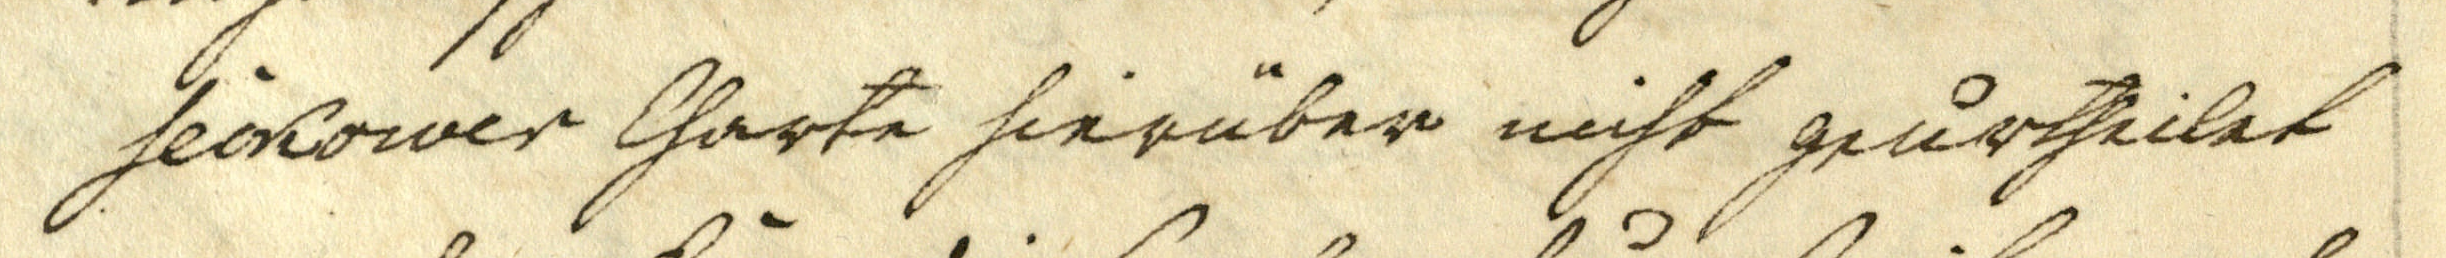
seckower Charte hierüber nicht geurtheilet
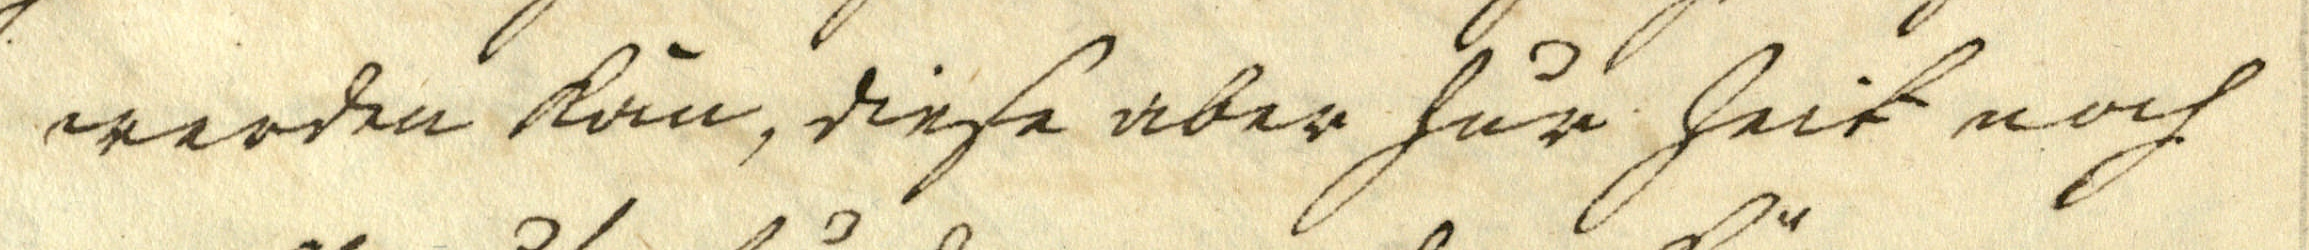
werden kan, diese aber zur Zeit noch
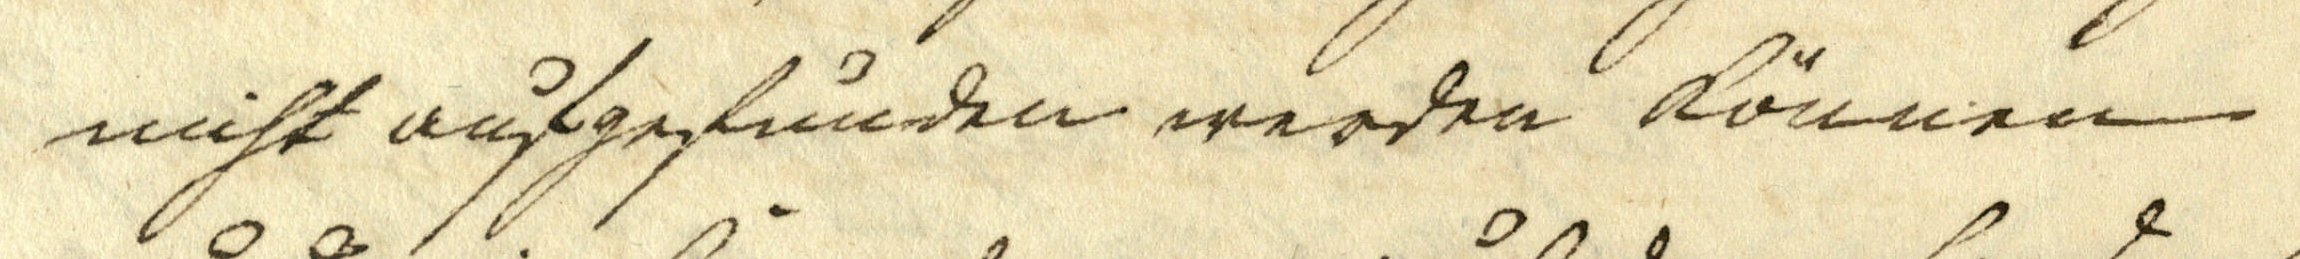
nicht aufgefunden werden können
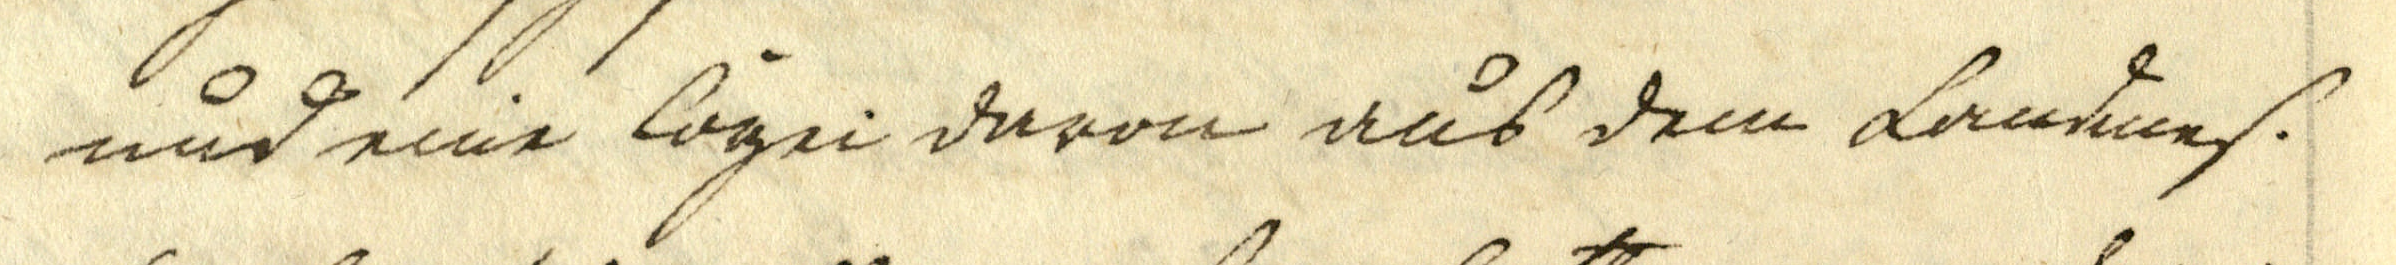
und eine Copei davon aus dem Landmes¬
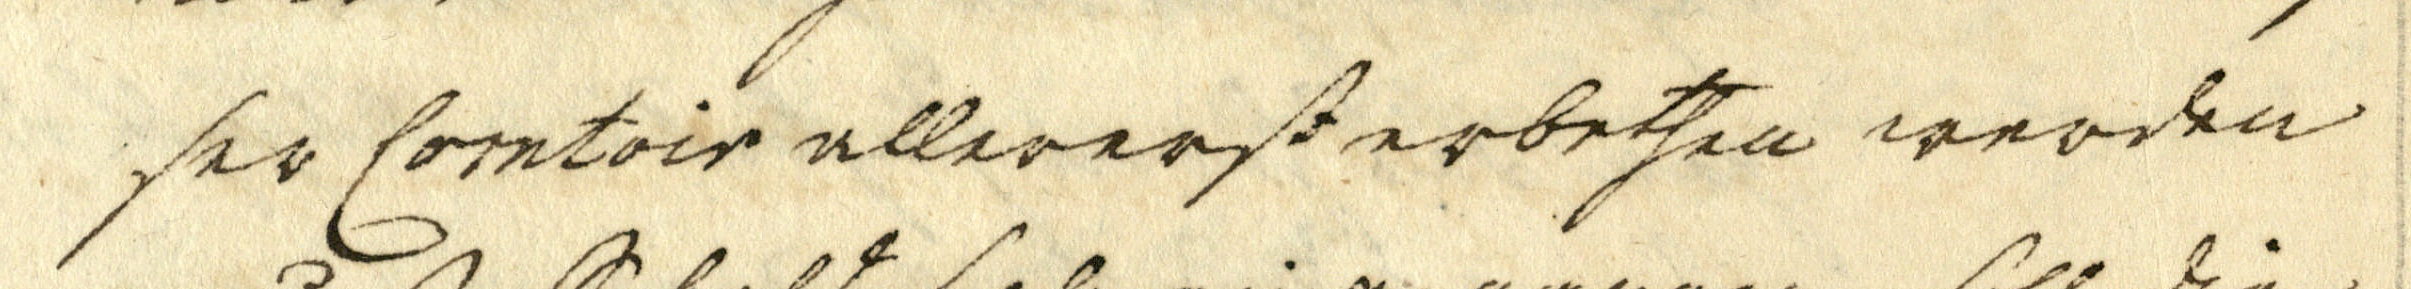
ser Comtoir allererst erbethen werden
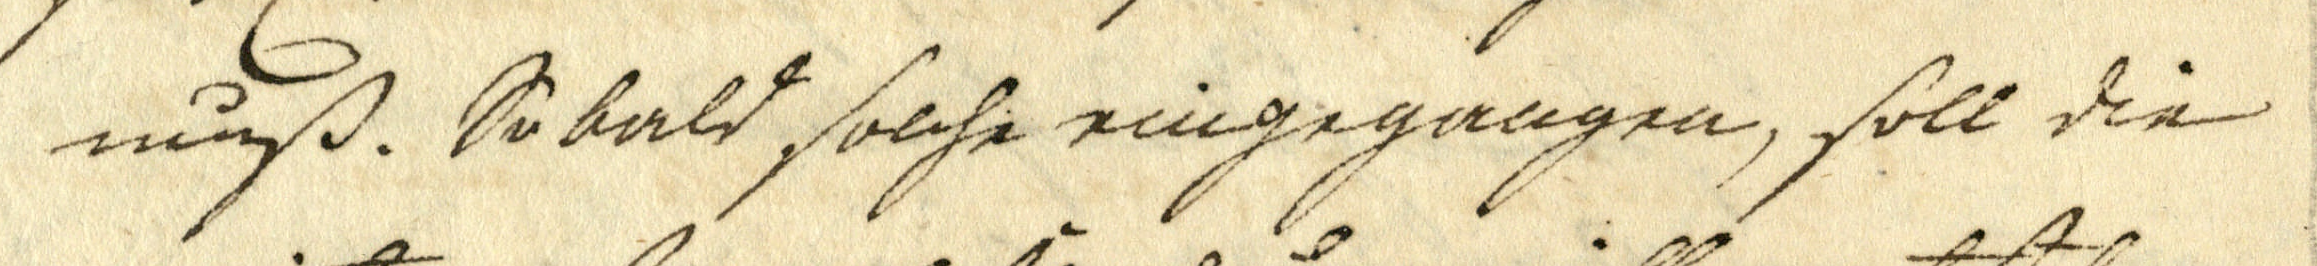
muß. So bald solche eingegangen, soll die
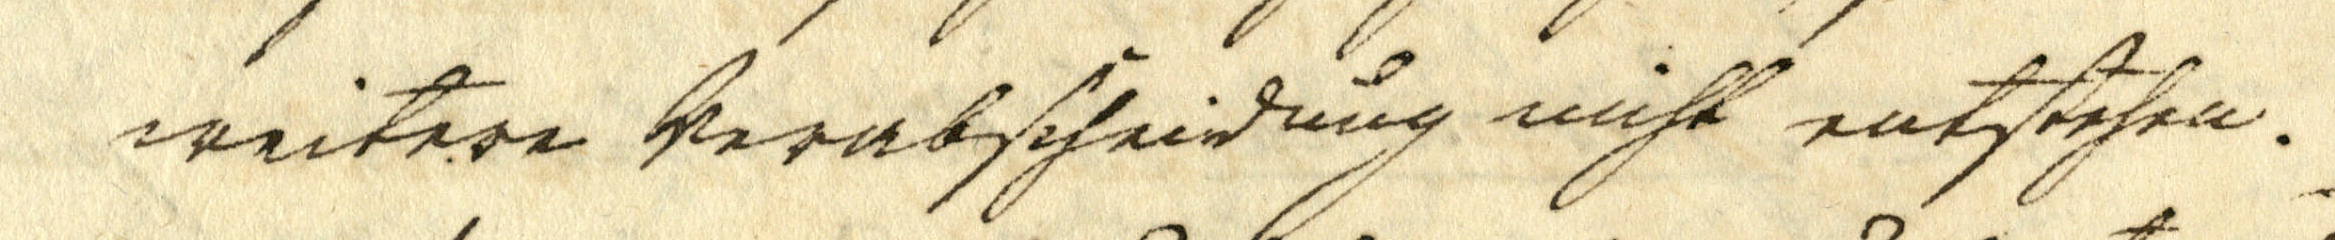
weitere Verabscheidung nicht entstehen.
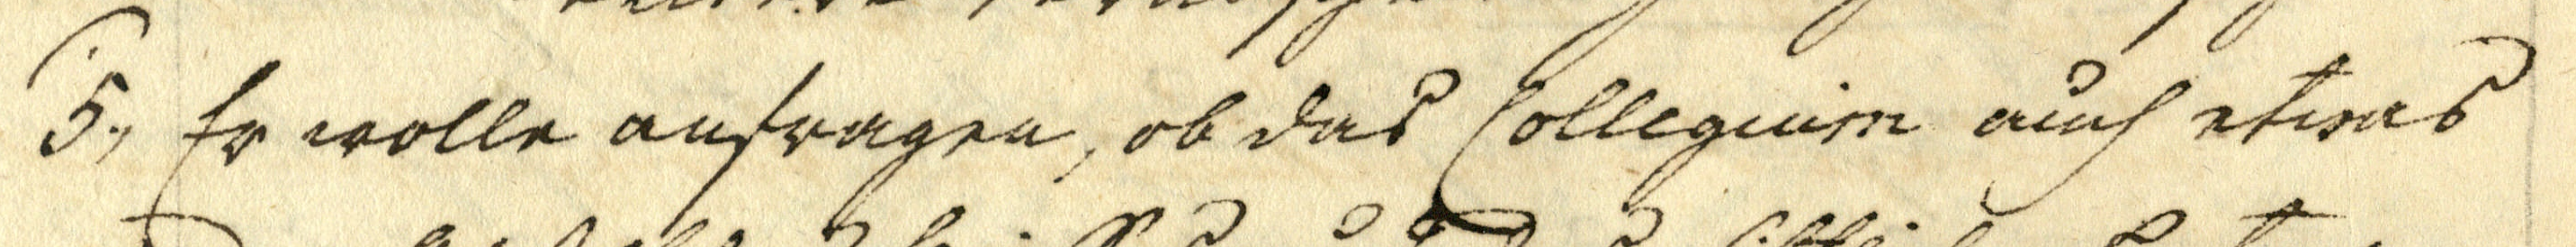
5., Er wolle anfragen, ob das Collegium auch etwas
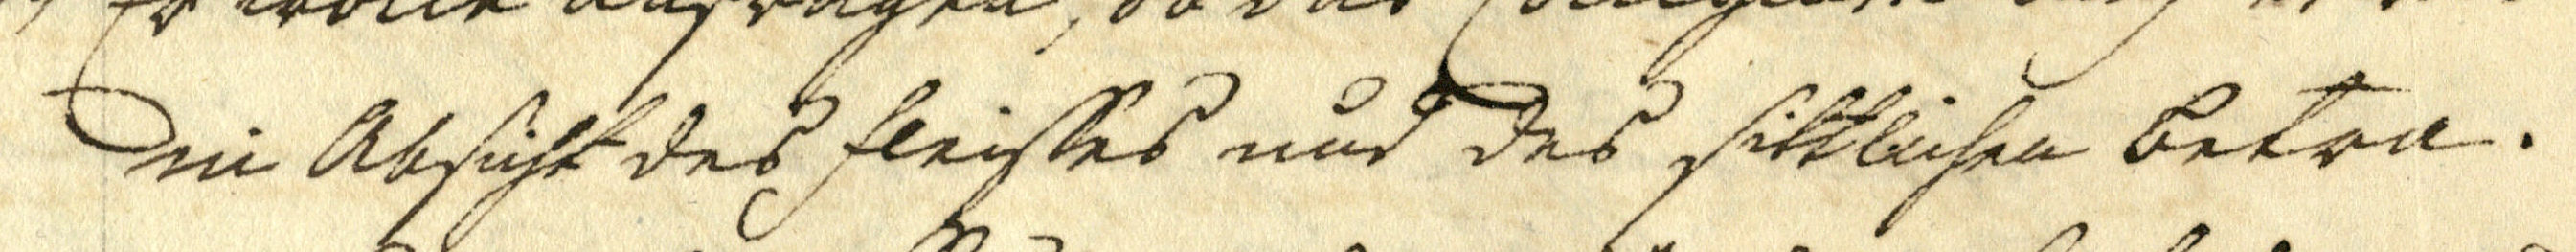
in Absicht des Fleisses und des sittlichen Betra¬
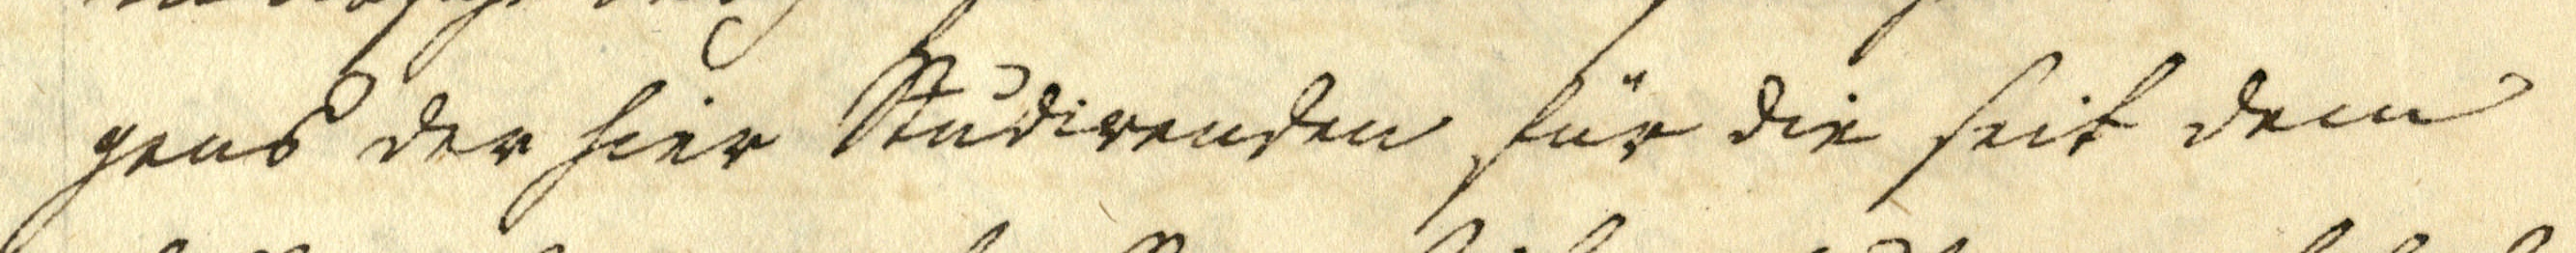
gens der hier Studirenden für die seit dem
